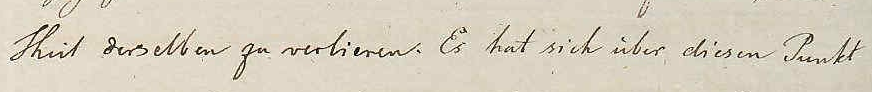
Theil derselben zu verlieren. Es hat sich über diesen Punkt
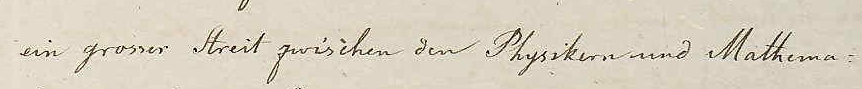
ein grosser Streit zwischen den Physikern und Mathema-
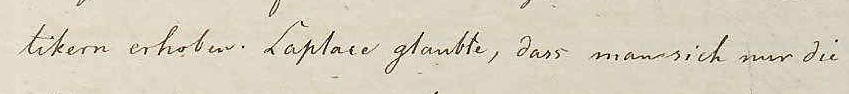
tikern erhoben. Laplace glaubte, dass man sich nur die
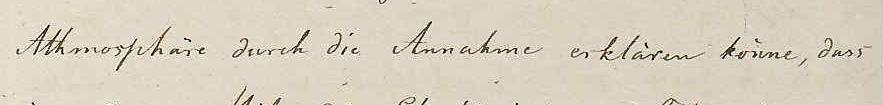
Athmosphäre durch die Annahme erklären könne, dass
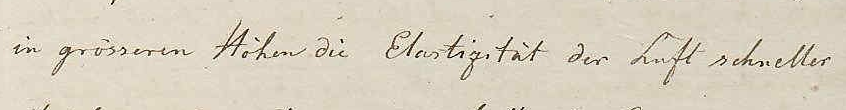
in grösseren Höhen die Elastizität der Luft schneller
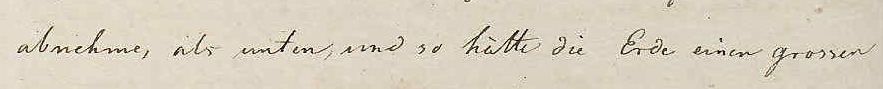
abnehme, als unten, und so hätte die Erde einen grossen
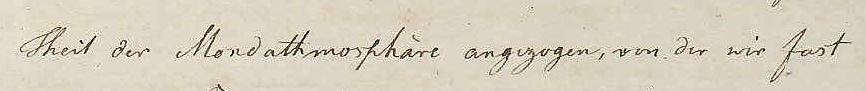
Theil der Mondathmosphäre angezogen, von der wir fast
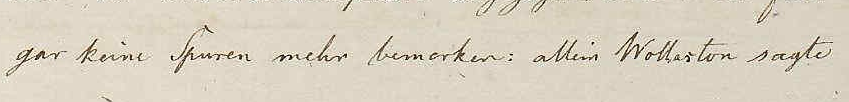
gar keine Spuren mehr bemerken: allein Wollaston sagte
